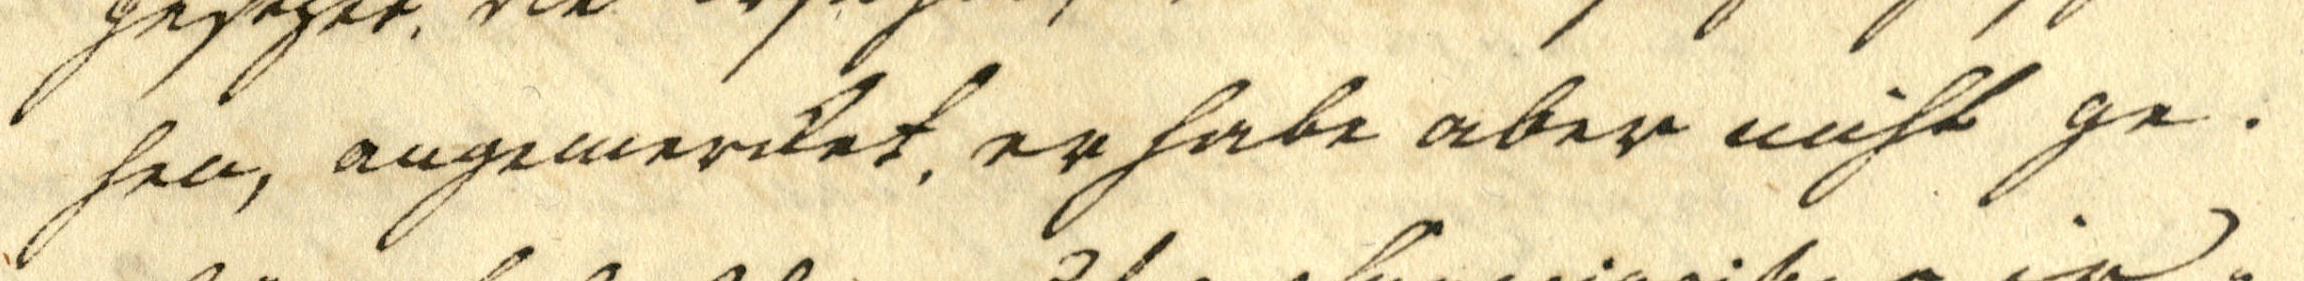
hen, angemercket, er habe aber nicht ge¬
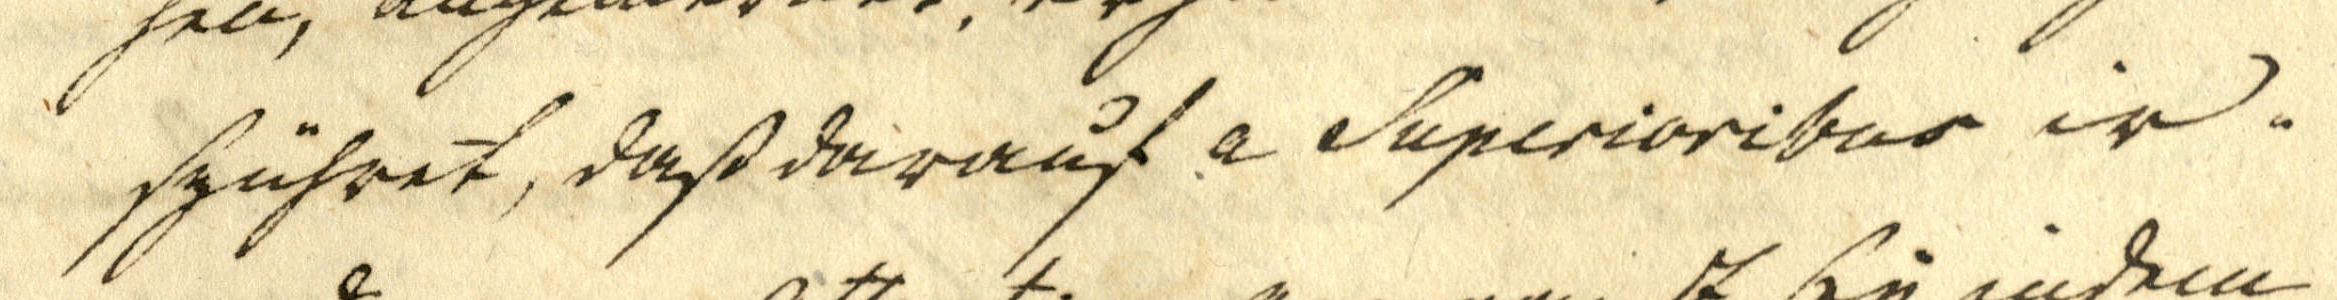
spühret, daß darauf a Superioribus ir¬
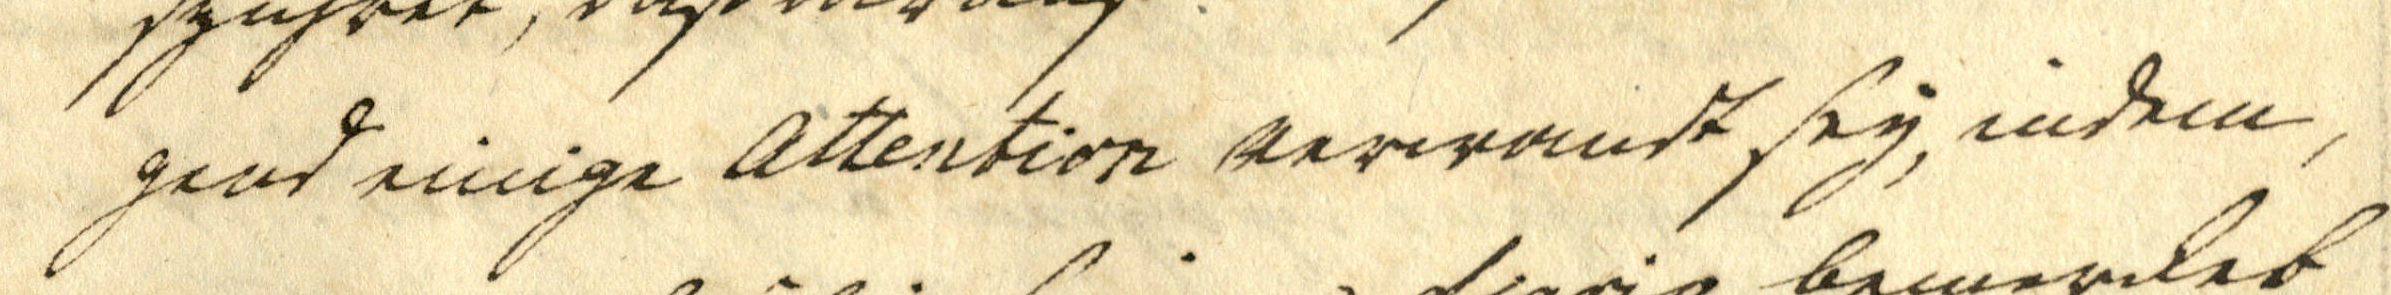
gend einige Attention verwandt seÿ, indem,
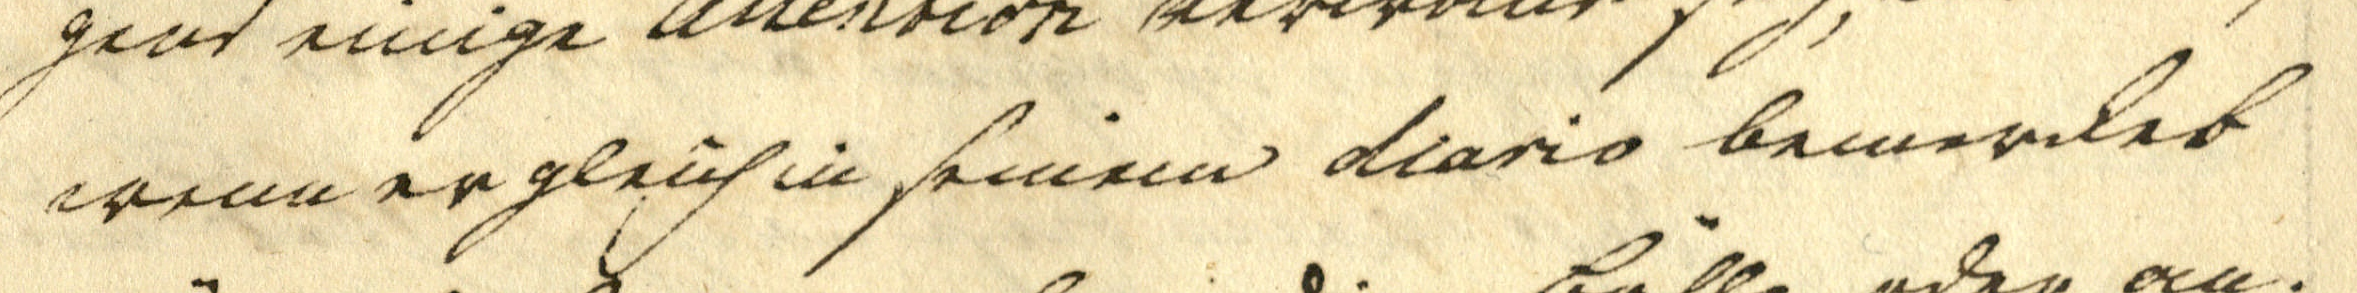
wenn er gleich in seinem diario bemercket
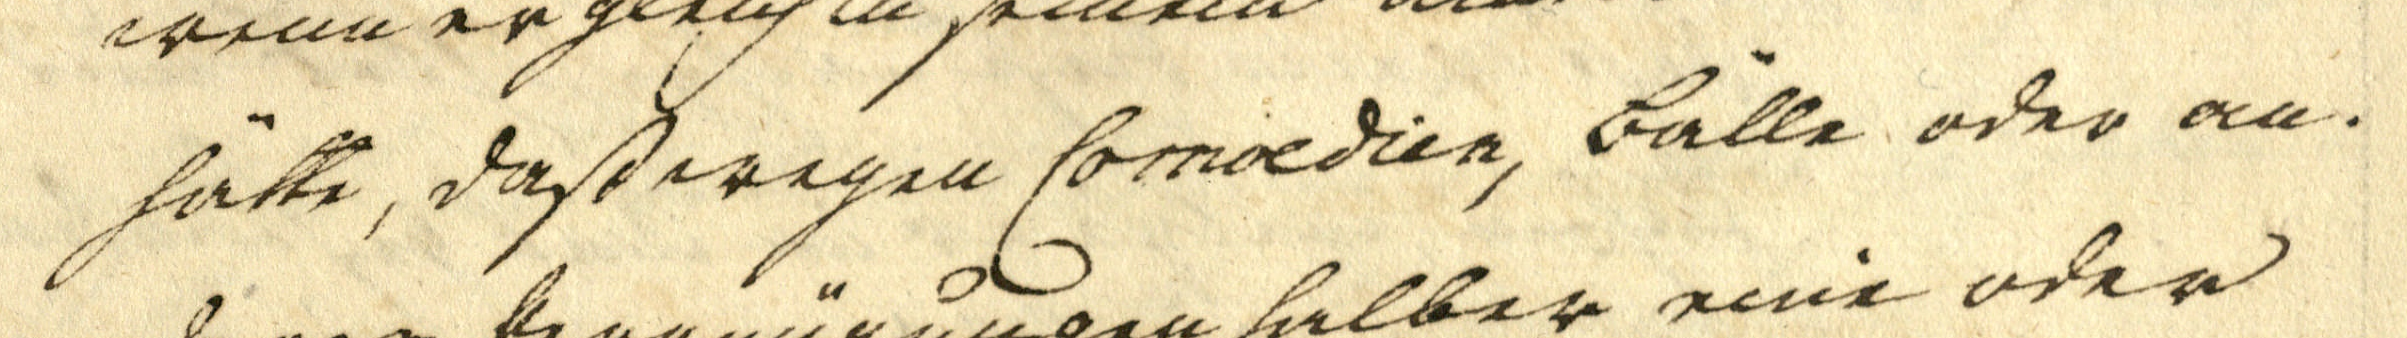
hätte, daß wegen Comoedien, Bälle oder an¬
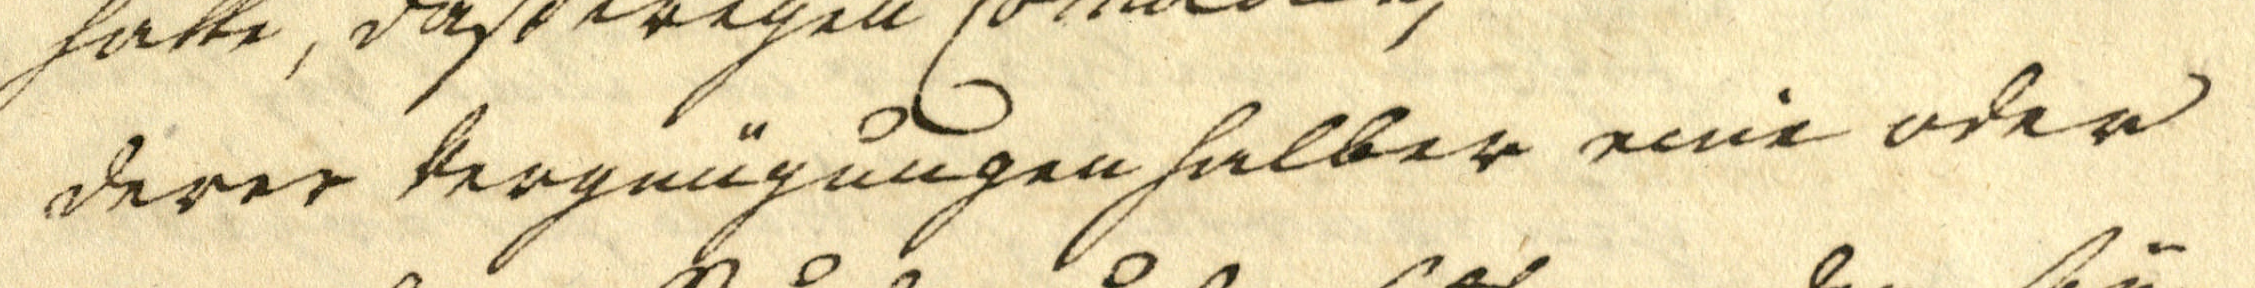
derer Vergnügungen halber eine oder
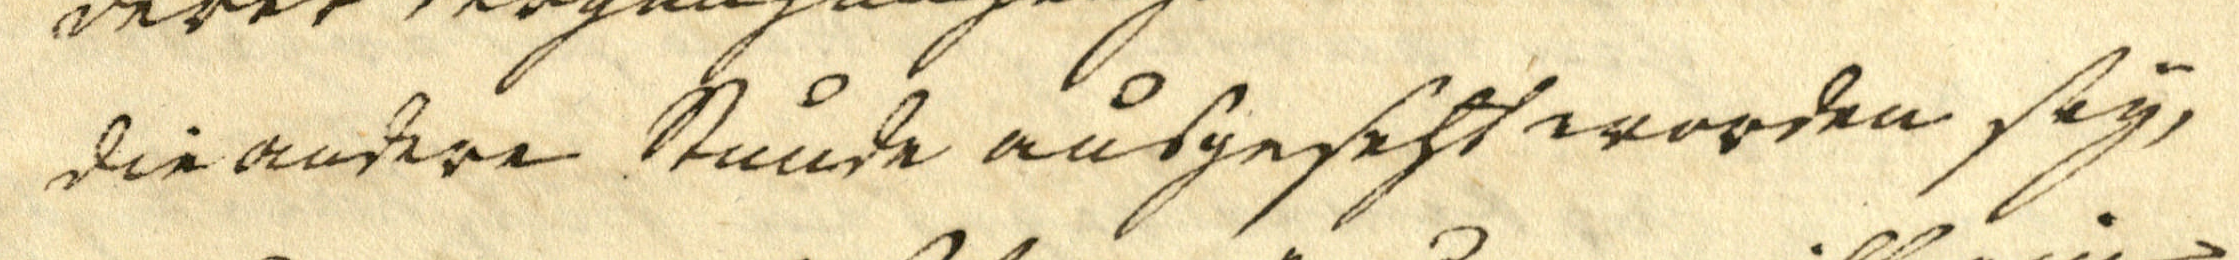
die andere Stunde ausgesetzt worden seÿ,
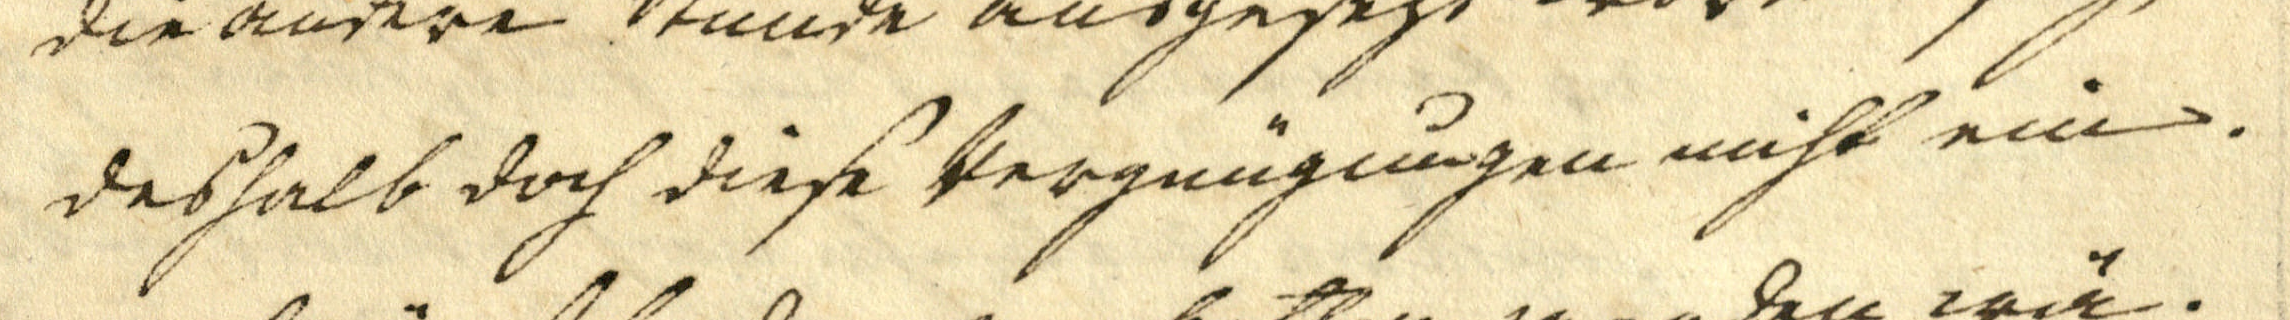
deshalb doch diese Vergnügungen nicht ein¬
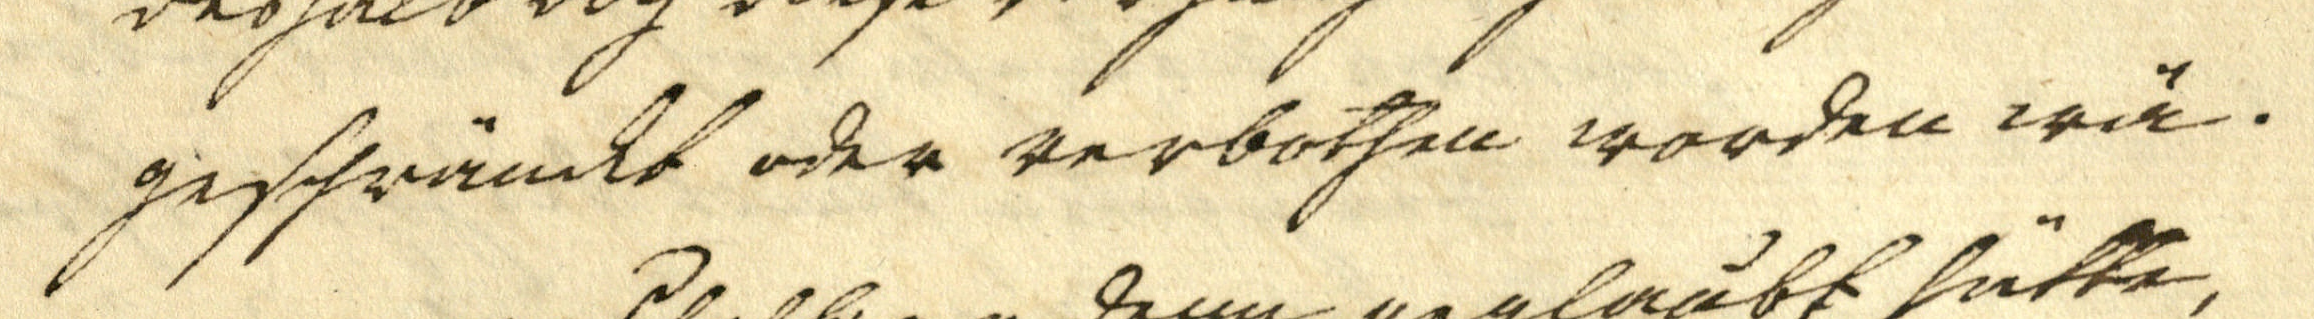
geschränckt oder verbothen worden wä¬
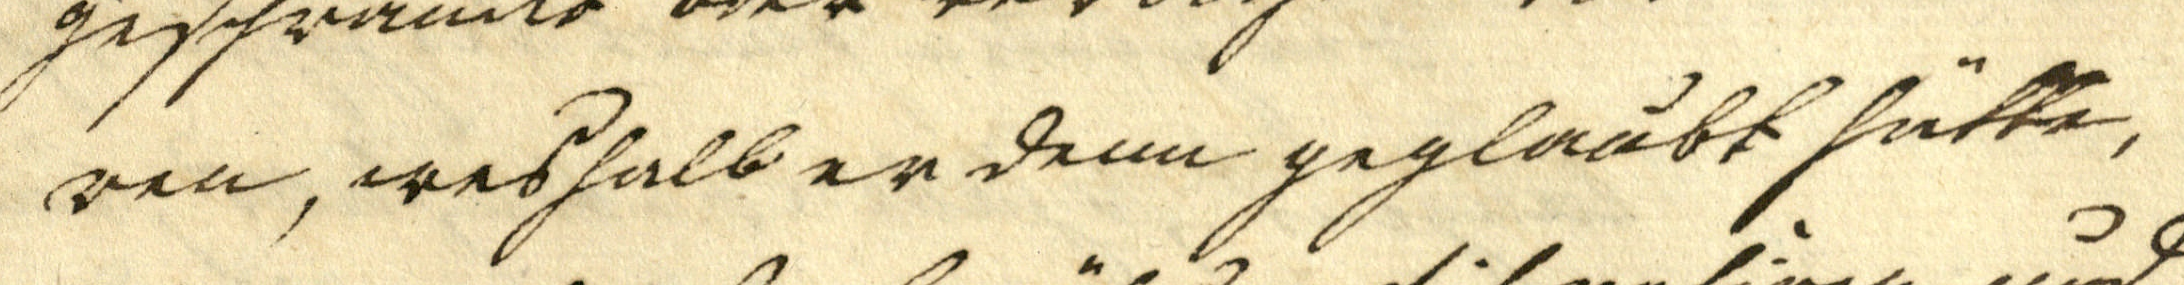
ren, weshalb er denn geglaubt hätte,
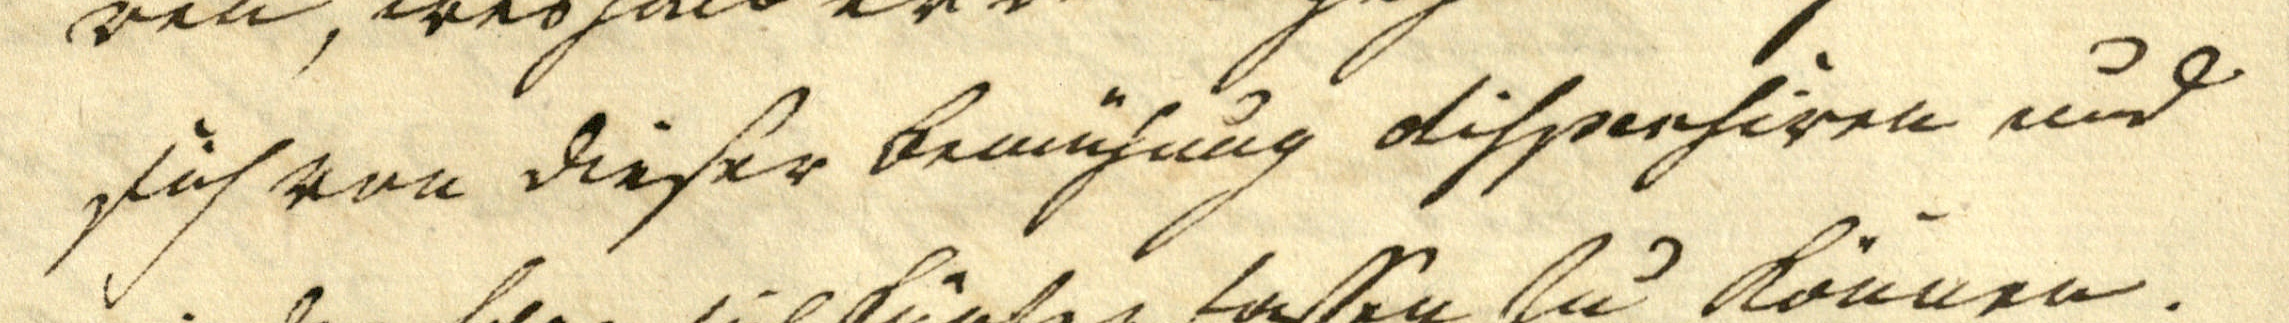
sich von dieser Bemühung dispensiren und
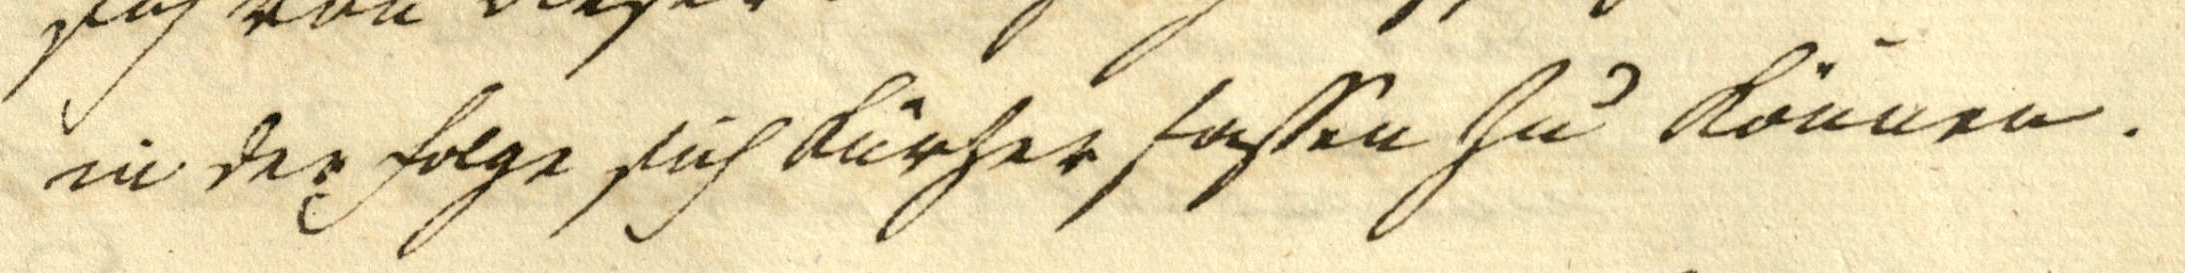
in der Folge sich kürzer fassen zu können.
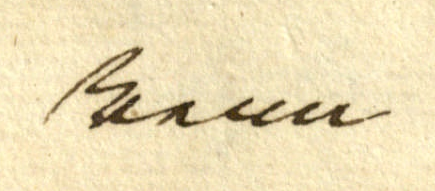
Wenn
